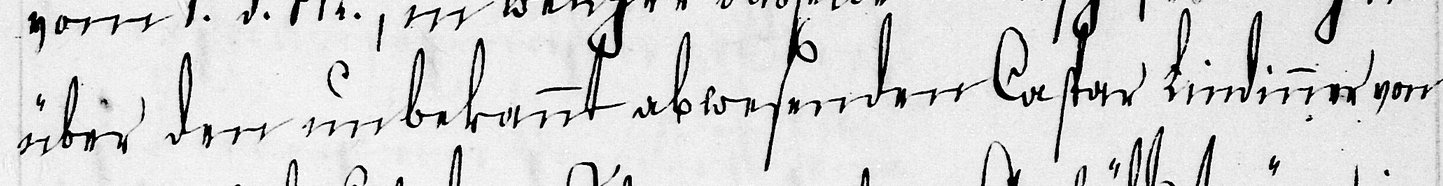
über den unbekannt abwesenden Caspar Lindinner von
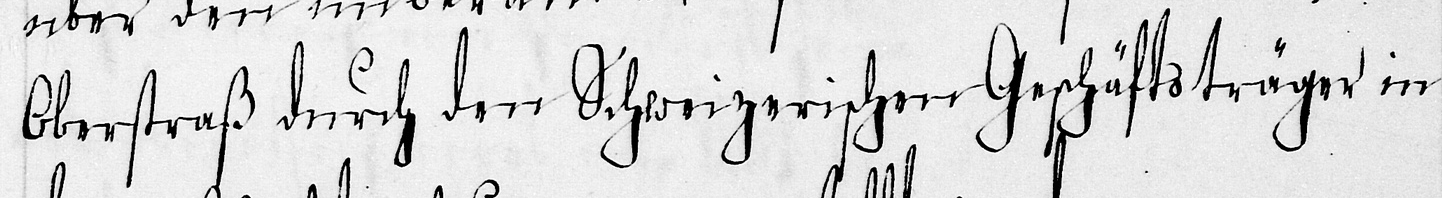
Oberstraß durch den Schweizerischen Geschäftsträger in
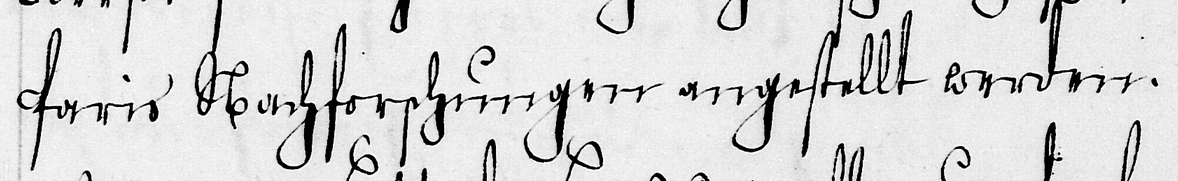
Paris Nachforschungen angestellt werden.
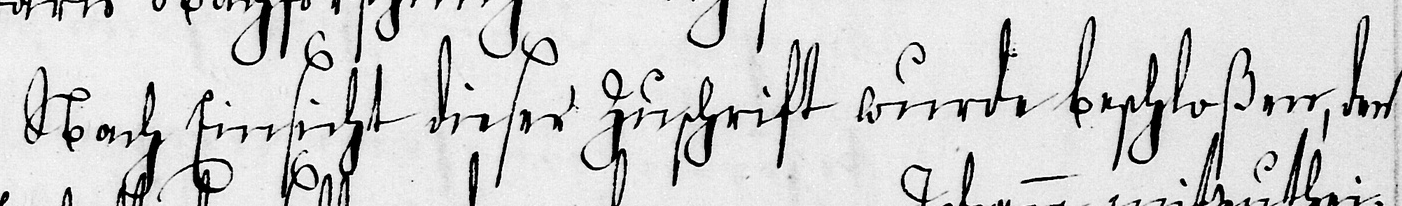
Nach Einsicht dieser Zuschrift wurde beschloßen, den
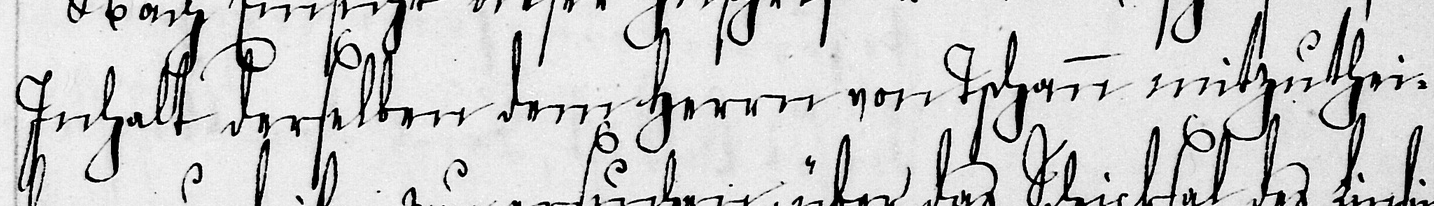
Inhalt derselben dem Herrn von Tschann mitzuthei¬
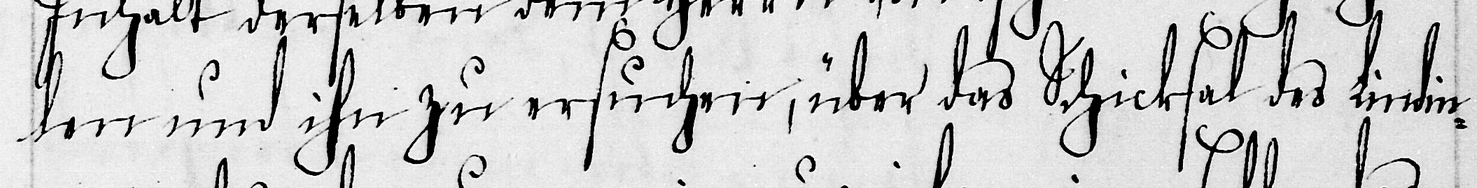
len und ihn zu ersuchen, über das Schicksal des Lindi¬
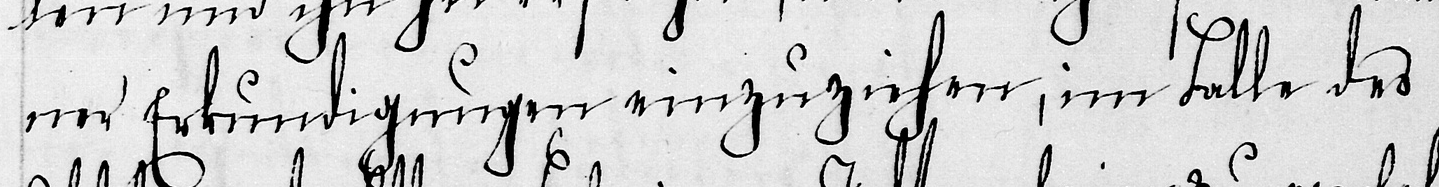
nner Erkundigungen einzuziehen, im Falle des
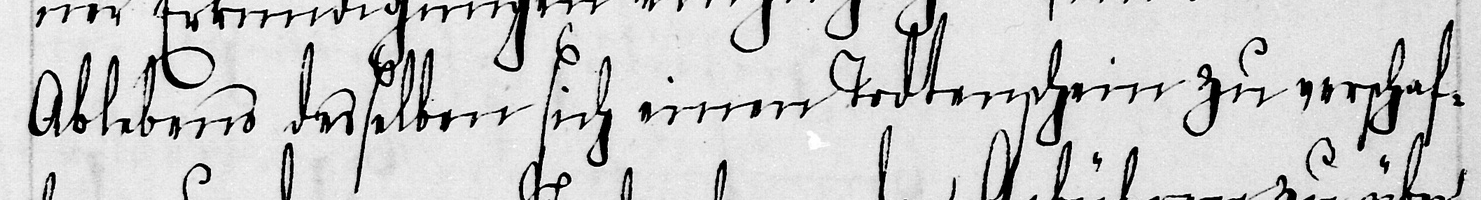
Ablebens desselben sich einen Todtenschein zu verschaf¬
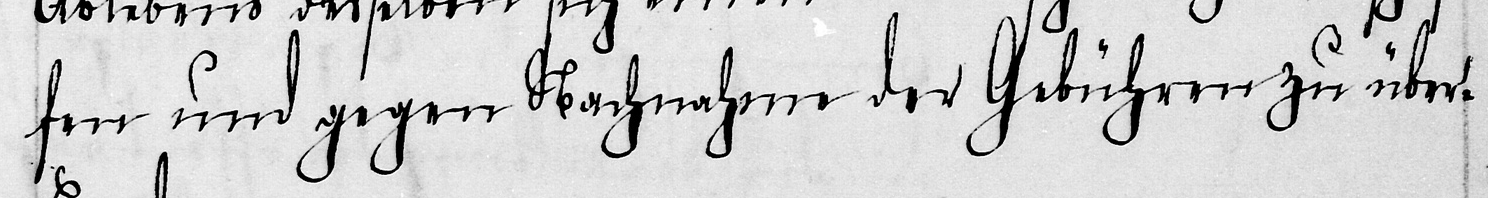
fen und gegen Nachnahme der Gebühren zu über¬
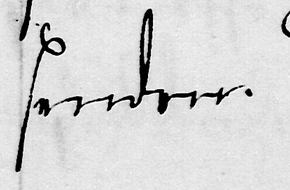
senden.
